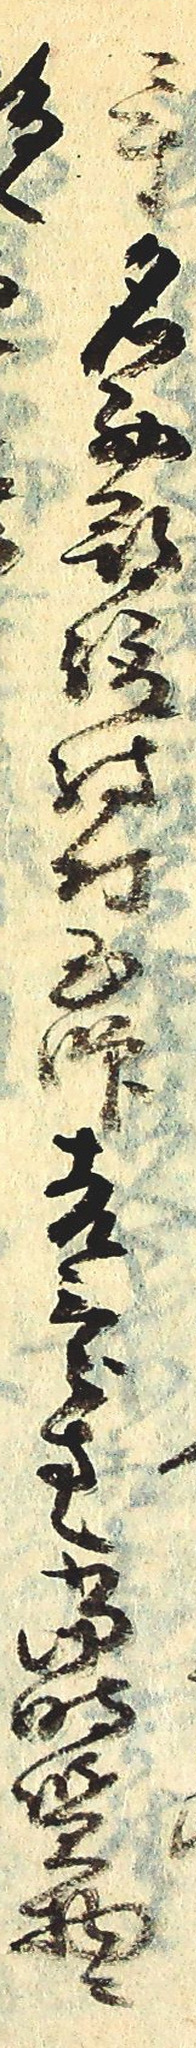に付名西郡諏訪村玉師吉三郎方へ当時質物に
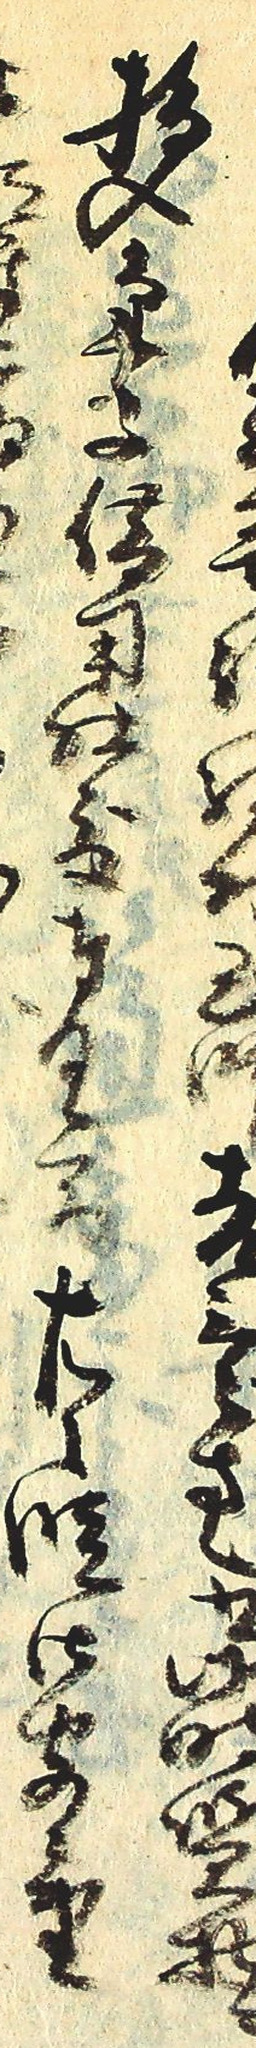指入金子借用仕度奉存候間右之段御聞届
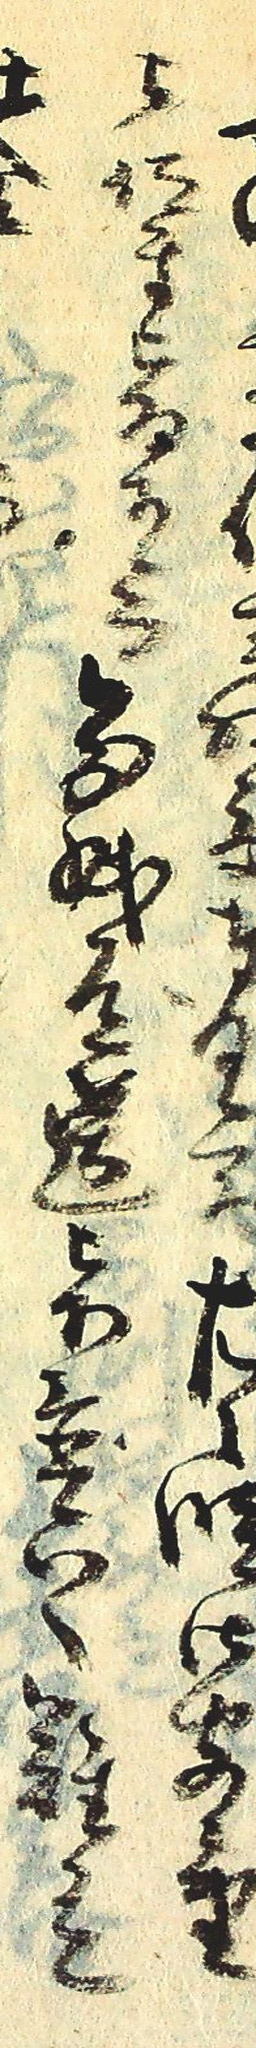被仰付被為下候て別紙道送被下置候はゝ難有
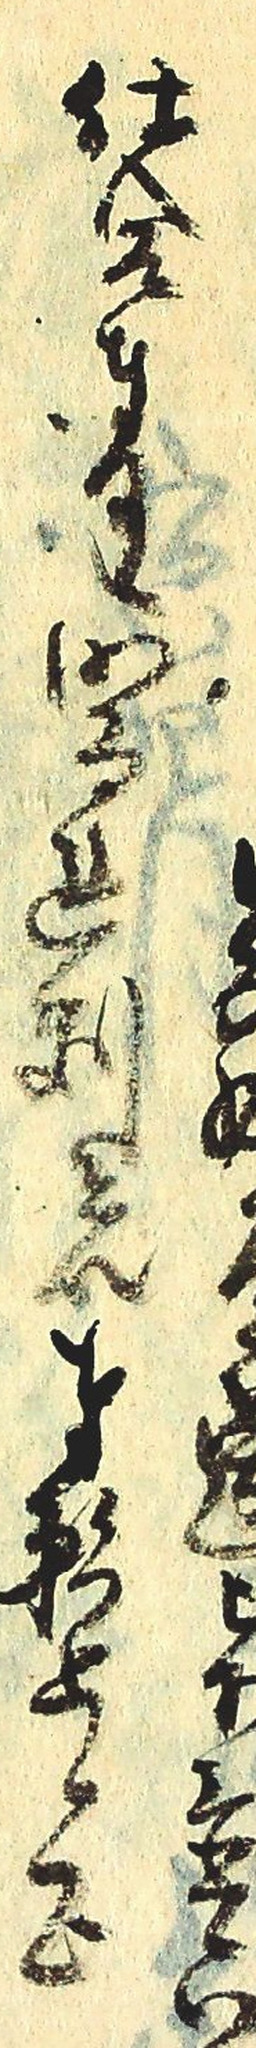仕合奉存候仍て連判を以奉願上候以上
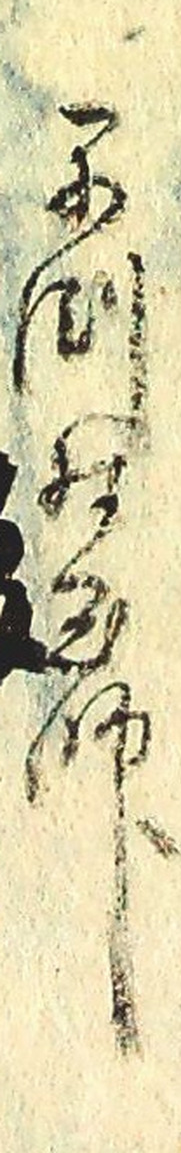早淵村玉師
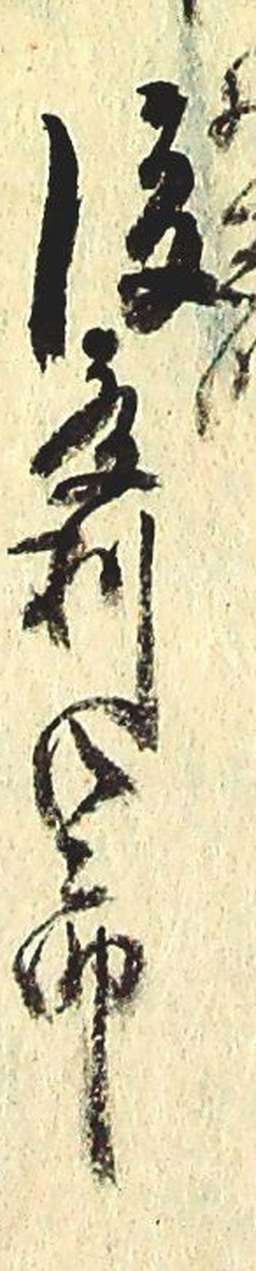後藤利八郎
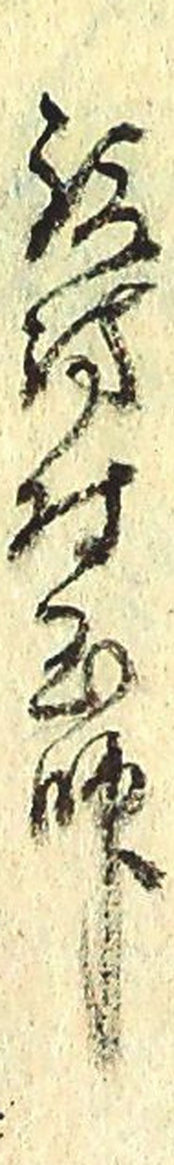早淵村玉師
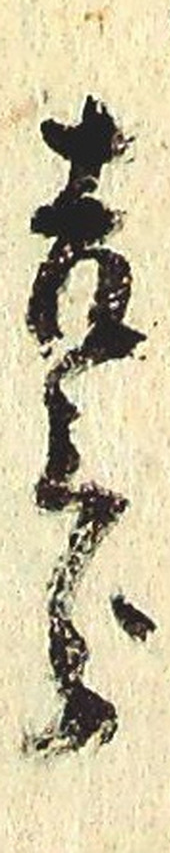吉三郎
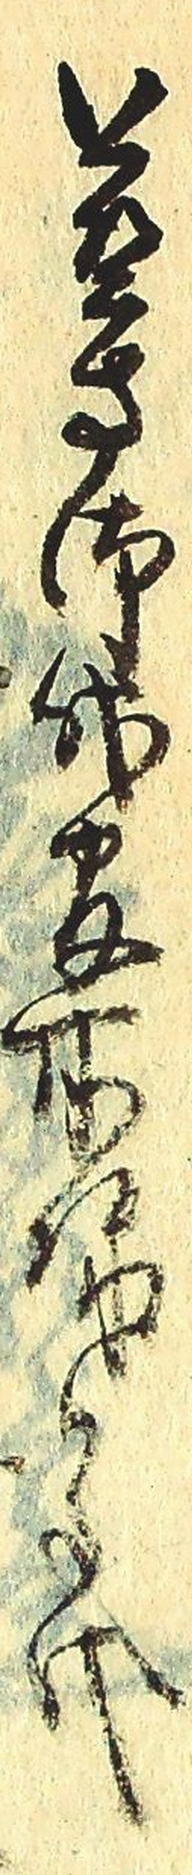藍方御代官所様御手代
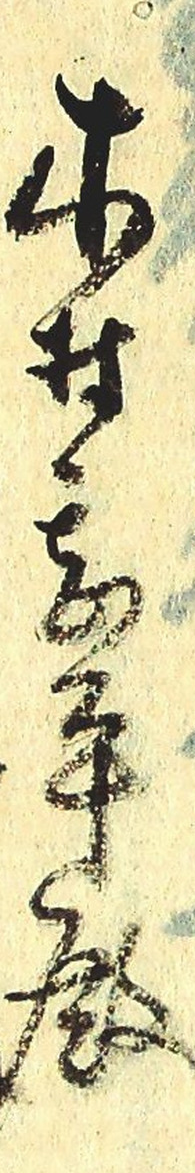木村甚平殿
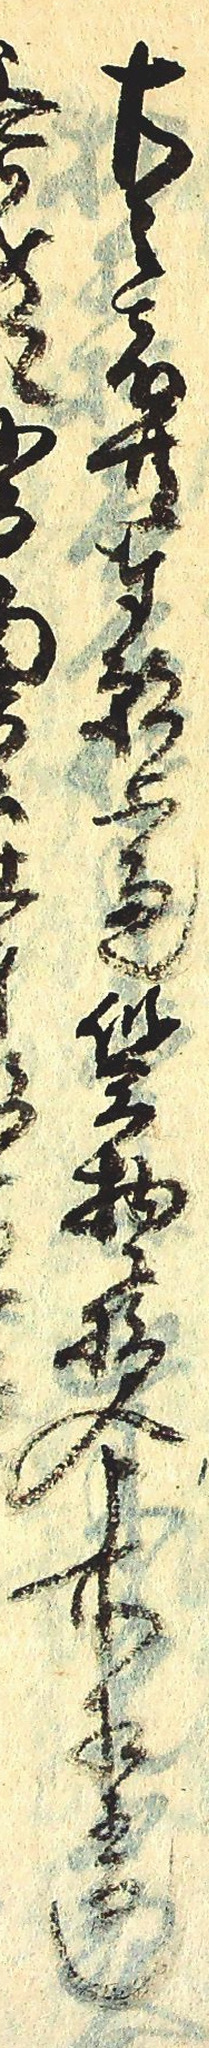右之者共奉願上通質物に指入申所相違
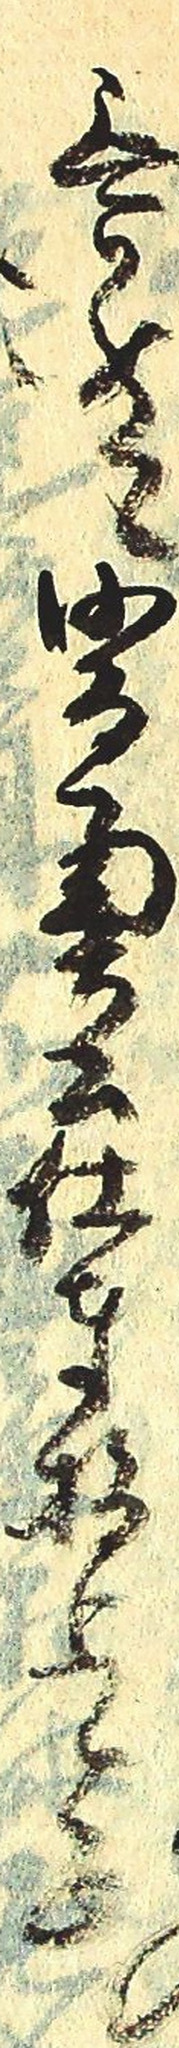無御座候仍て奥書仕奉指上候以上
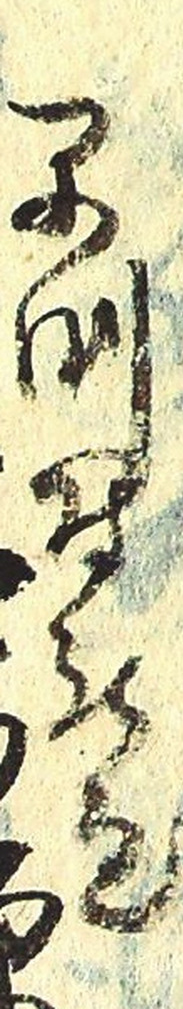早淵村庄屋
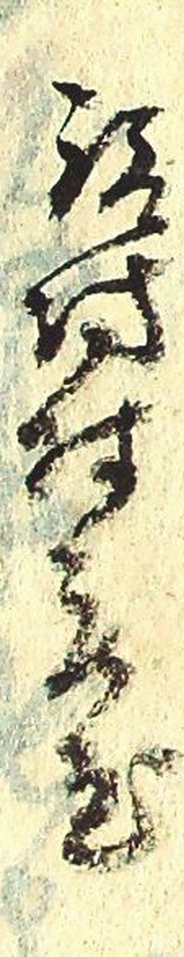早淵村庄屋
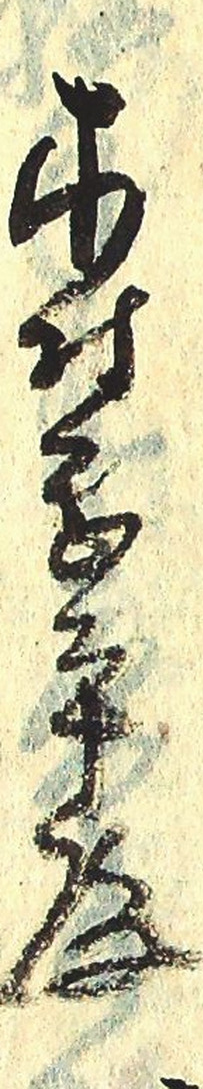木村甚平殿
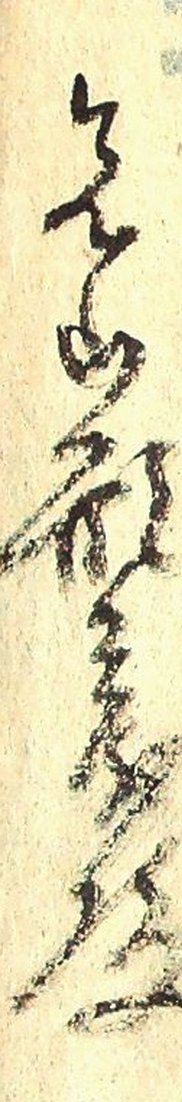先山形兵衛殿
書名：諸御願書控(弐番）
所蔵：鳴門教育大学 Naruto University of Education
